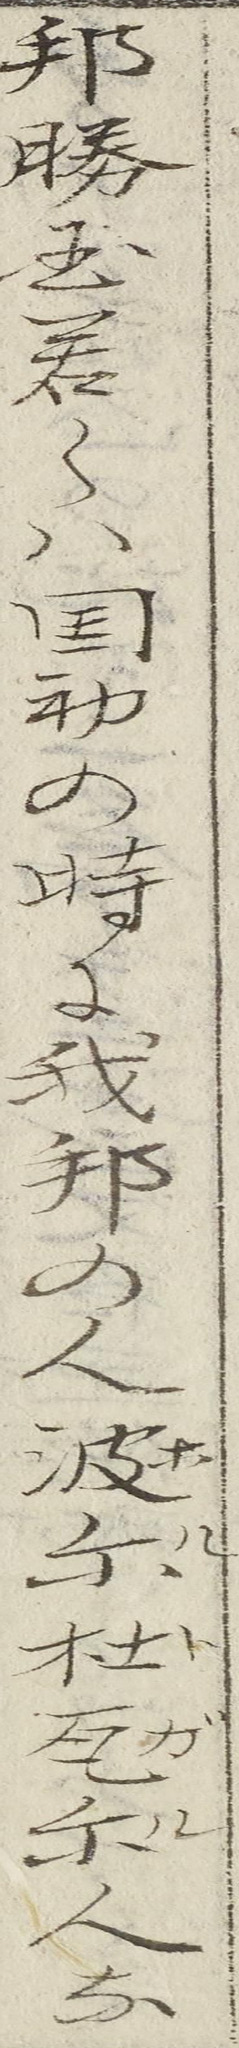邦勝国若くは国初の時に我邦の人波杜瓦尓人な
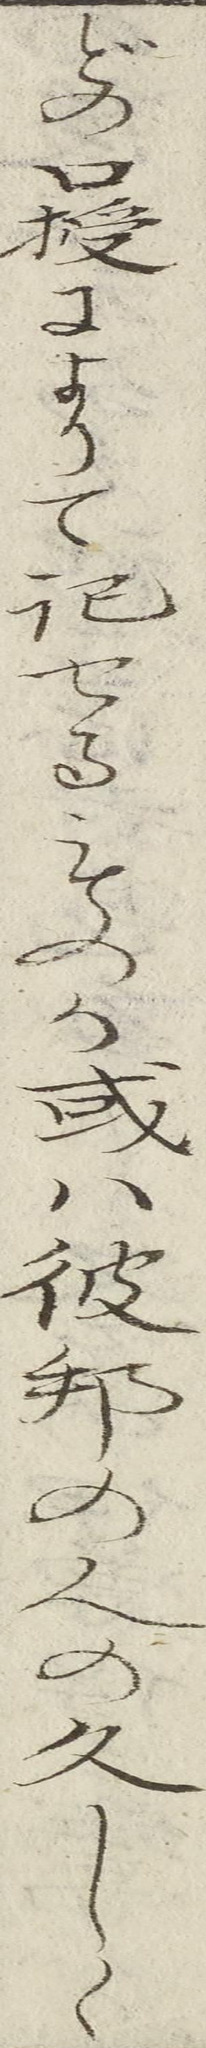どの口授によりて記せるものか或は彼邦の人の久しく
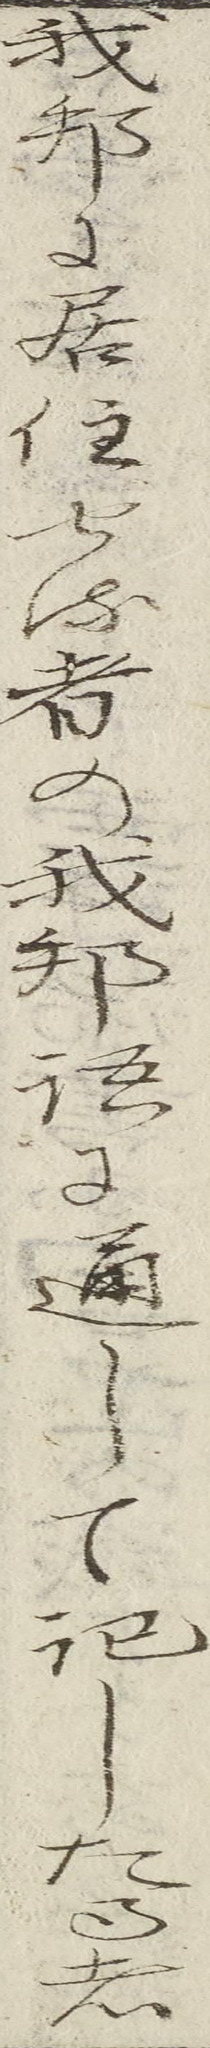我邦に居住せる者の我邦語に通して記したる者
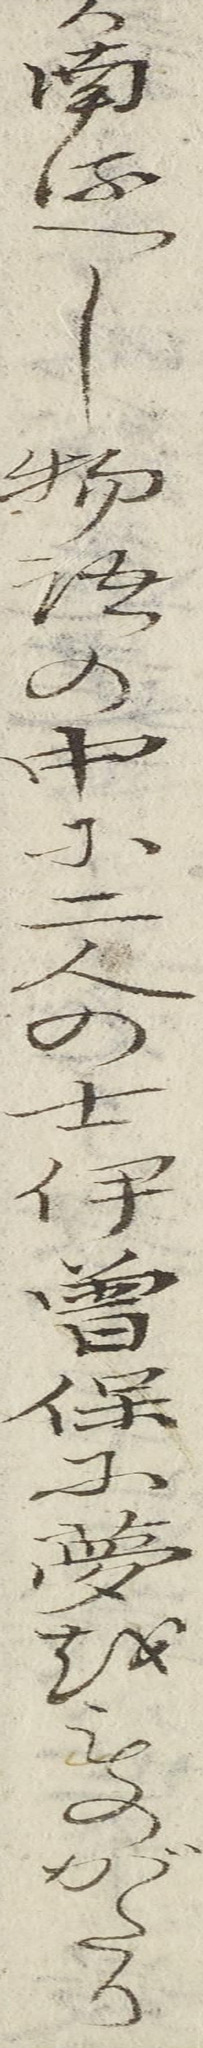かなるへし物語の中に二人の士伊曽保に夢をものがたり
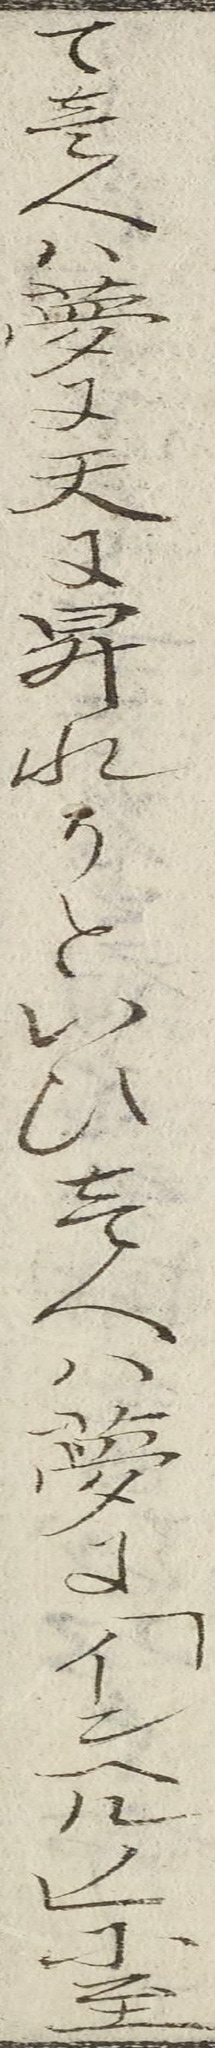て壱人は夢に天に昇れりといひ壱人は夢に「インヘルノ」に至
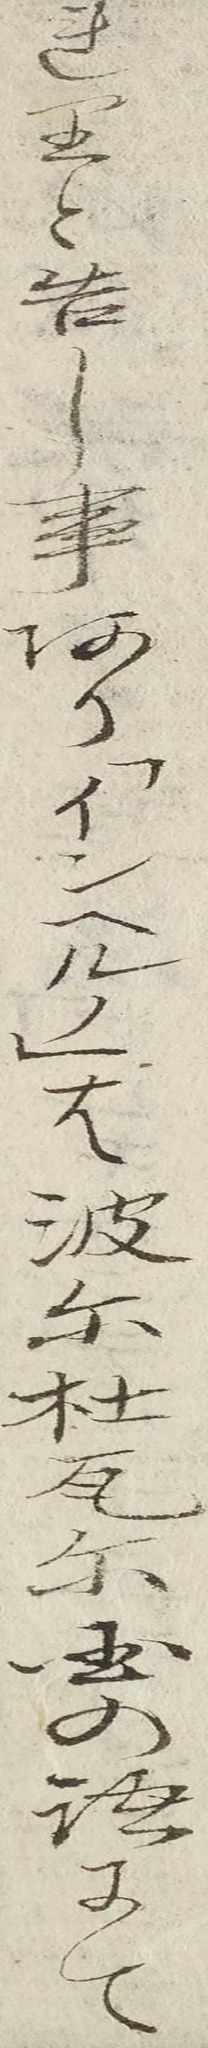れりと告し事有「インヘルノ」は波尓杜瓦尓国の語にて
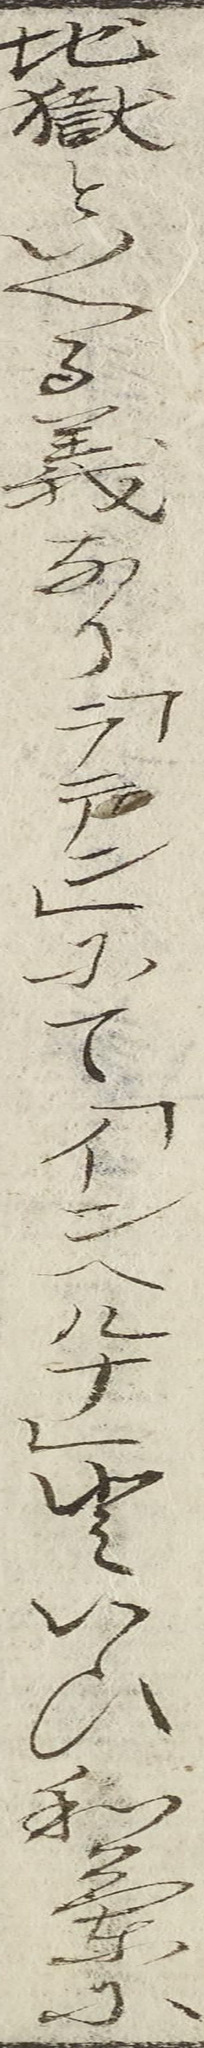地獄といへる義なり「ラテン」にて「インヘルナ」といひ和蘭に
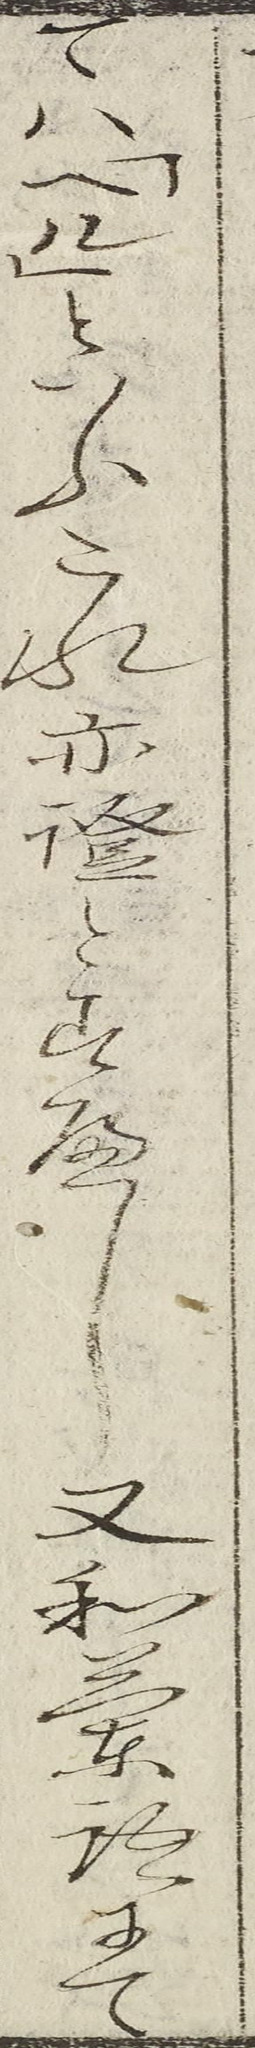ては「ヘル」といふこれ亦証とすへし又和蘭語にて
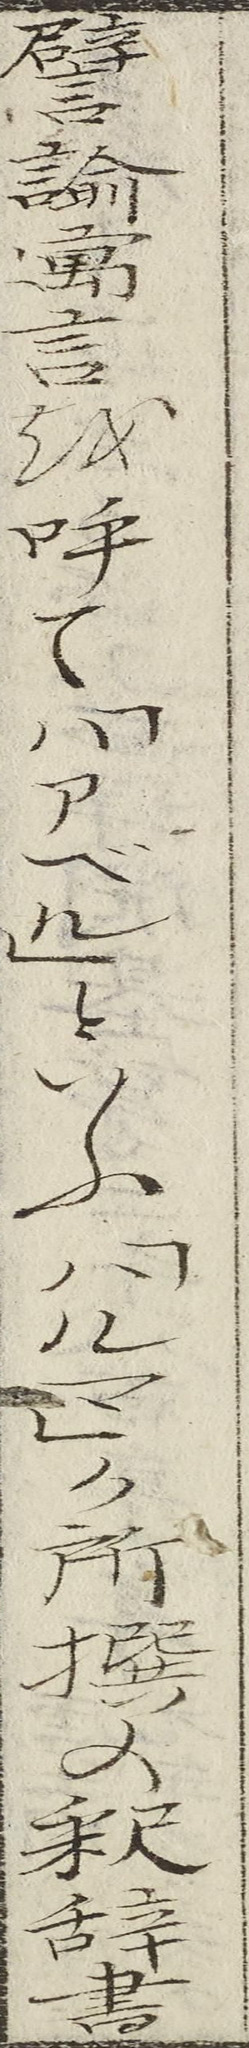譬諭寓言を呼て「ハアべル」といふ「ハルマ」か所撰の釈辞書
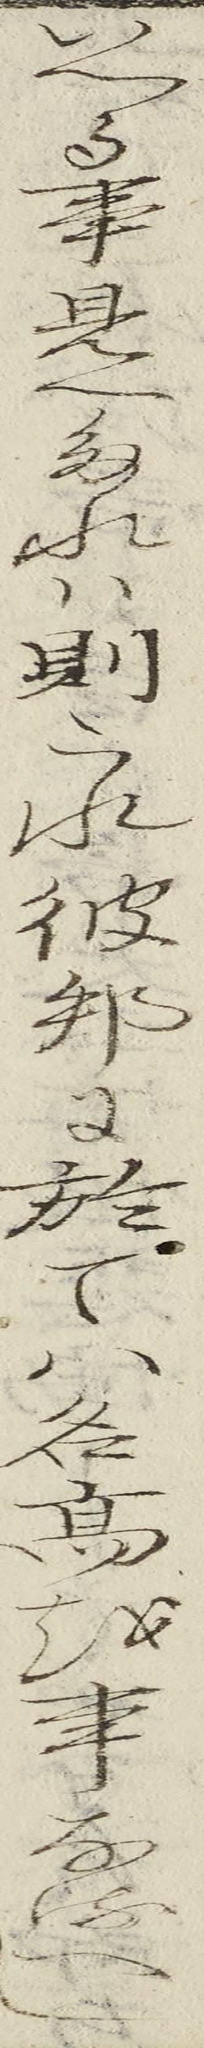いへる事見へたれは則これ彼邦に於ては名高き事なるへし
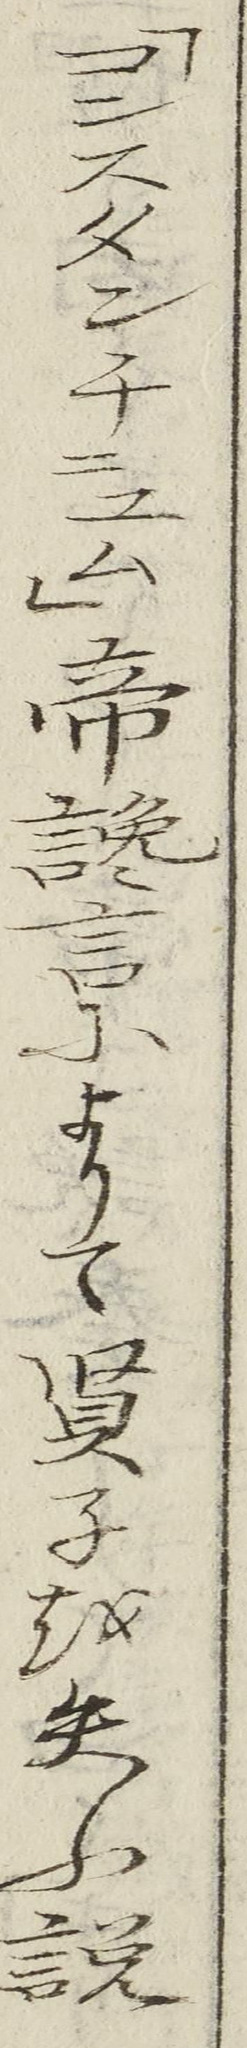「コンスタンチ二ユム」帝讒言によりて賢子を失ふ説
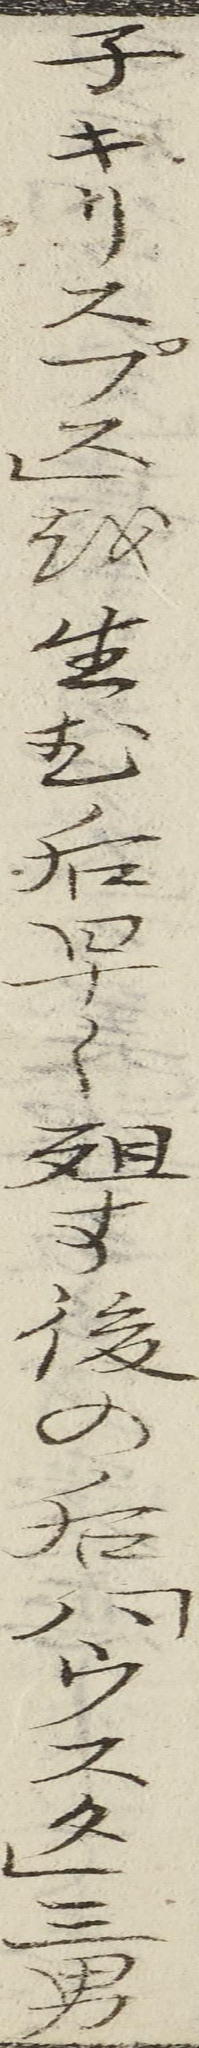子キリスプス」を生む后早く殂す後の后「ハウスタ」三男
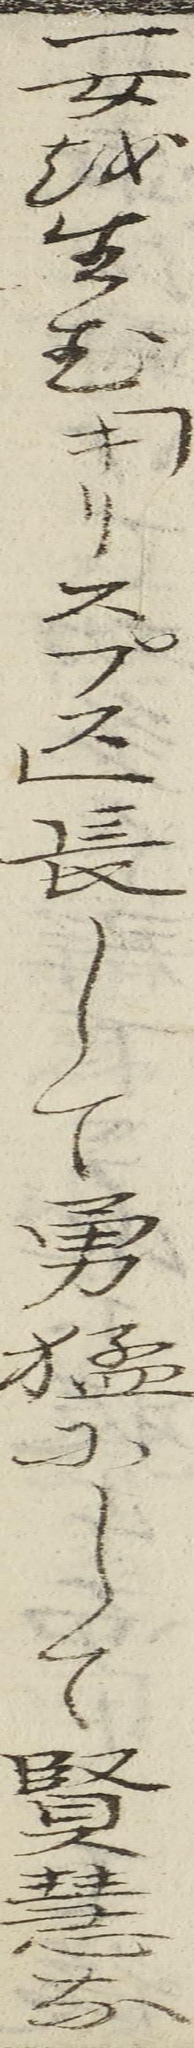一女を生む「キリスプス」長して勇猛にして賢慧な

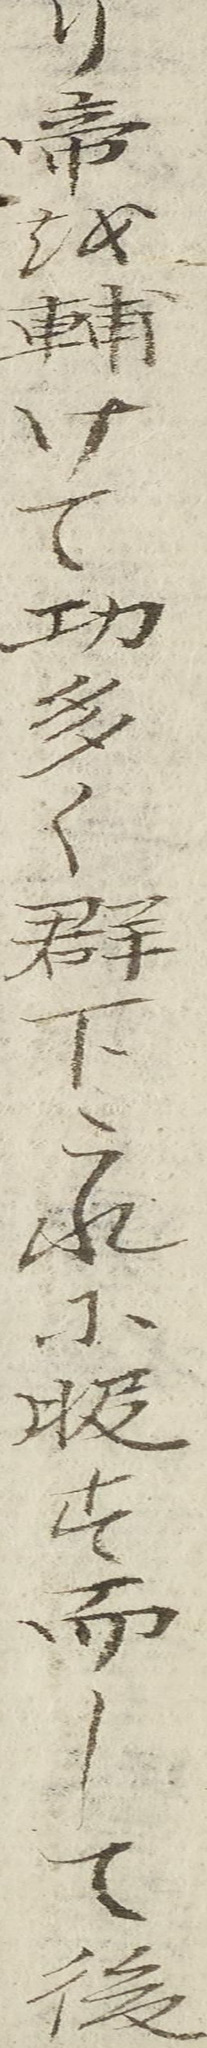り帝を輔けて功多く群下これに服す而して後
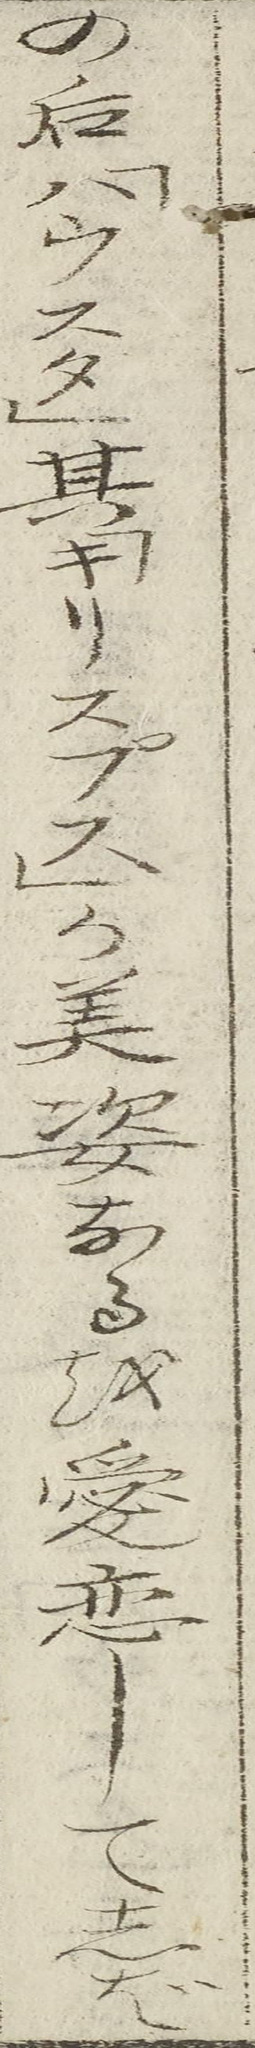の后「ハウスタ」其「キリスプス」か美姿なるを愛恋してしば
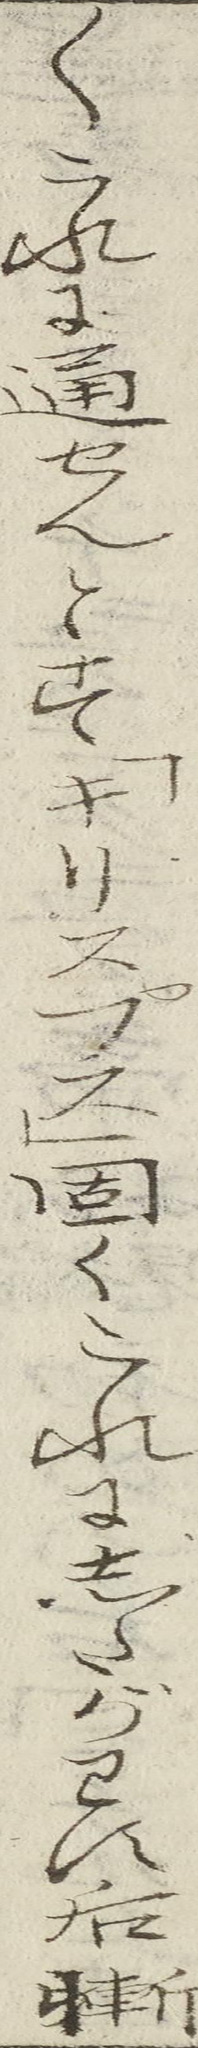〳〵これに通せんとす「キリスプス」固くこれにしたがわす后漸
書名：西洋雜記　乾
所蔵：東京大学地震研究所図書室 Earthquake Research Institute Library, The University of Tokyo, JAPAN
